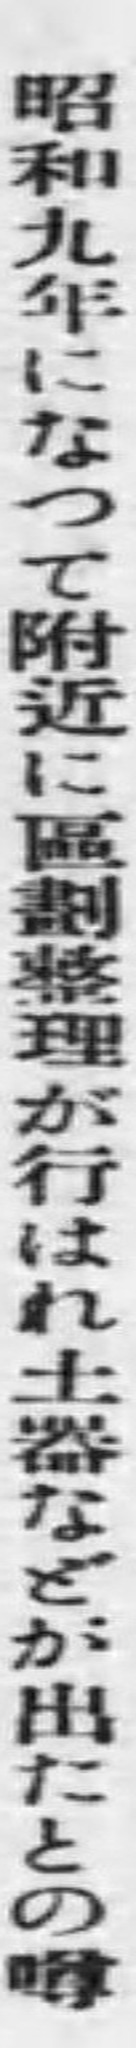昭和九年になつて附近に区画整理が行はれ土器などが出たとの噂
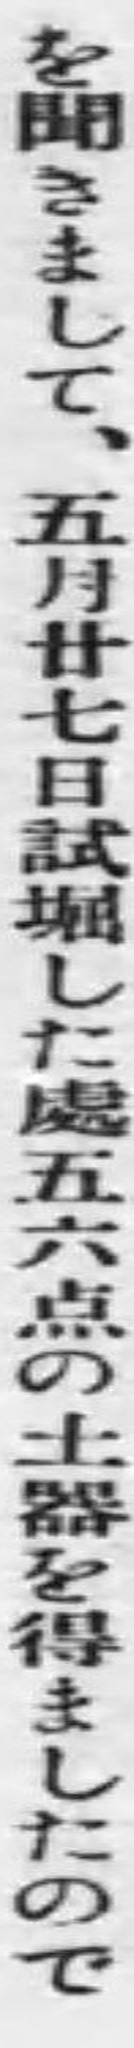を聞きまして、五月廿七日試堀した処五六点の土器を得ましたので
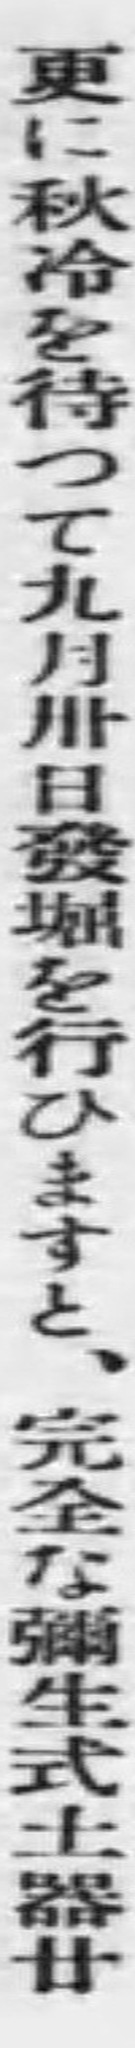更に秋冷を待つて九月卅日発堀を行ひますと、完全な弥生式土器廿
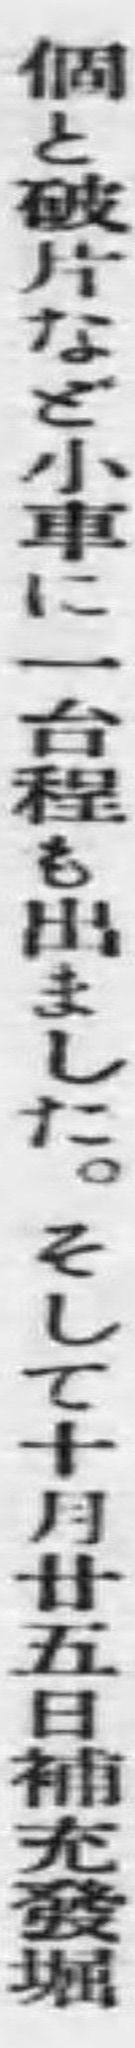個と破片など小車に一台程も出ました。そして十月廿五日補充発堀
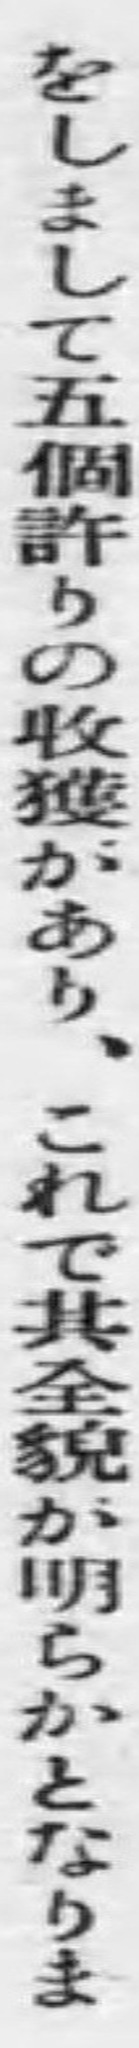をしまして五個許りの収獲があり、これで其全貌が明らかとなりま
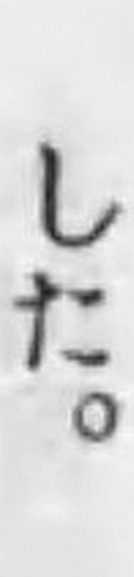した。
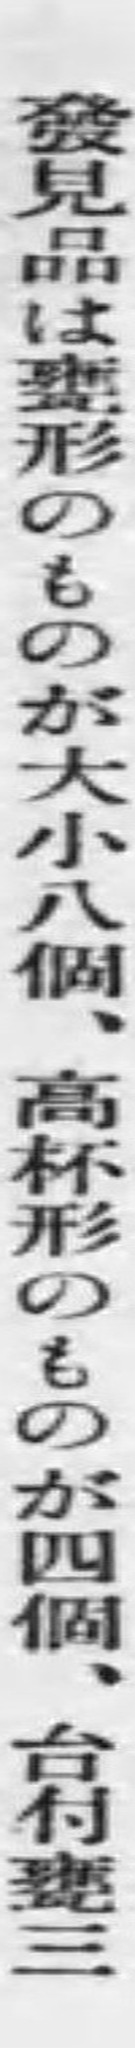発見品は甕形のものが大小八個、高杯形のものが四個、台付甕三
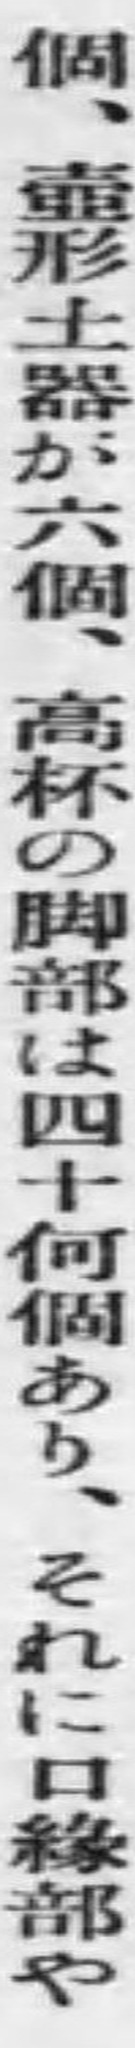個、壺形土器が六個、高杯の脚部は四十何個あり、それに口縁部や
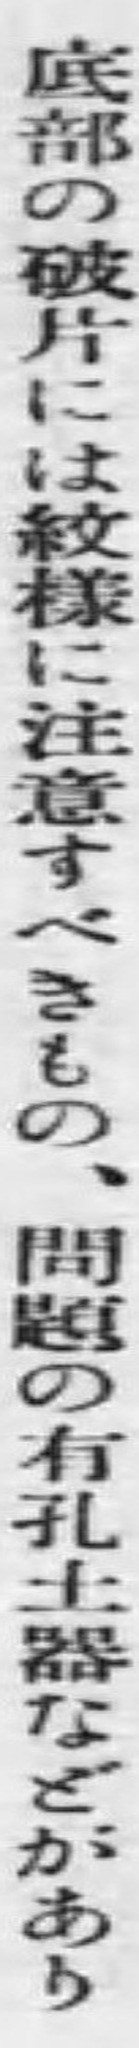底部の破片には紋様に注意すべきもの、問題の有孔土器などがあり
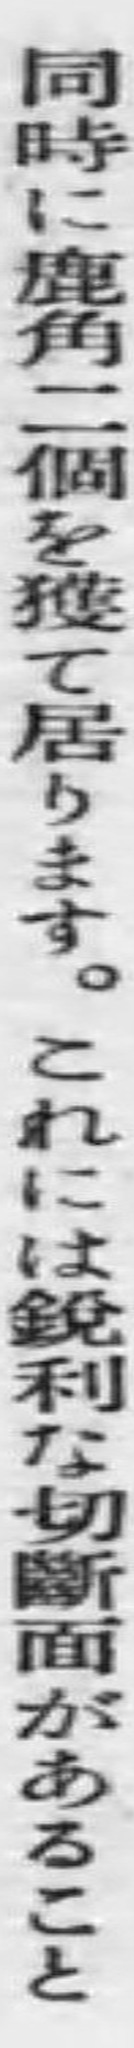同時に鹿角二個を獲て居ります。これには鋭利な切断面があること
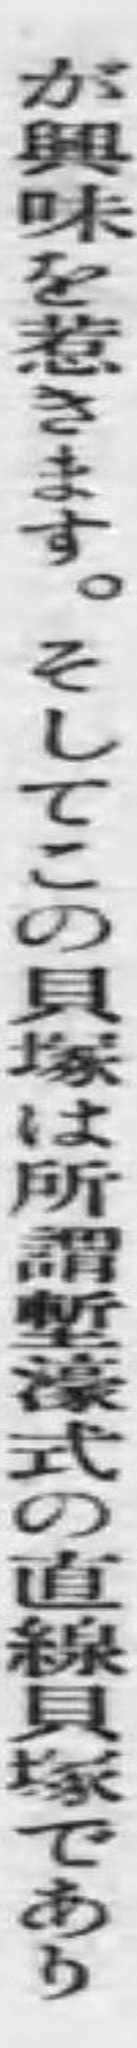が興味を惹きます。そしてこの貝塚は所謂塹濠式の直線貝塚であり
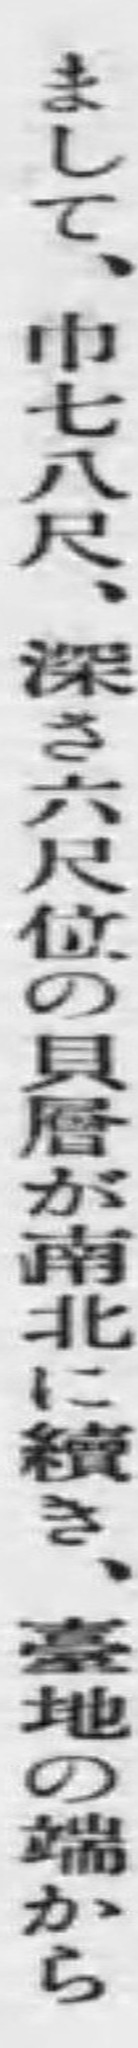まして、巾七八尺、深さ六尺位の貝層が南北に続き、台地の端から
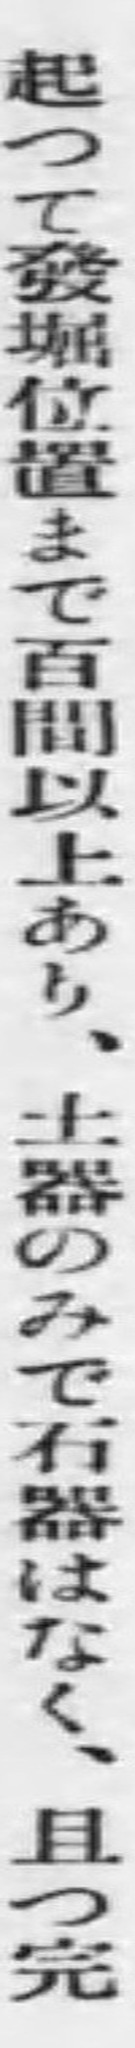起つて発堀位置まで百間以上あり、土器のみで石器はなく、且つ完
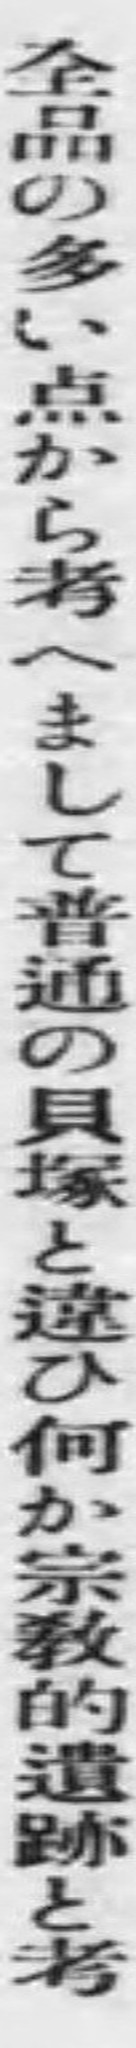全品の多い点から考へまして普通の貝塚と違ひ何か宗教的遺跡と考
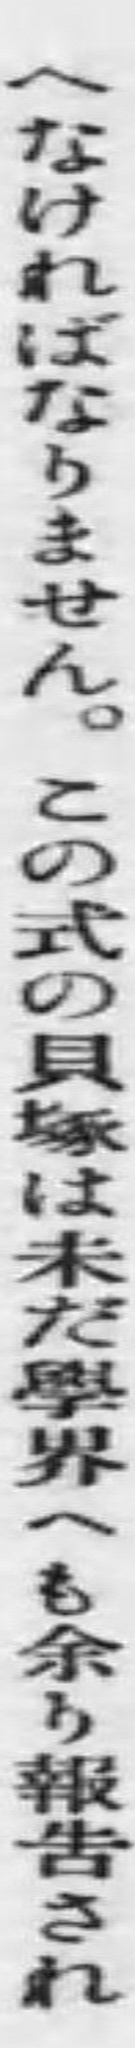へなければなりません。この式の貝塚は未だ学界へも余り報告され
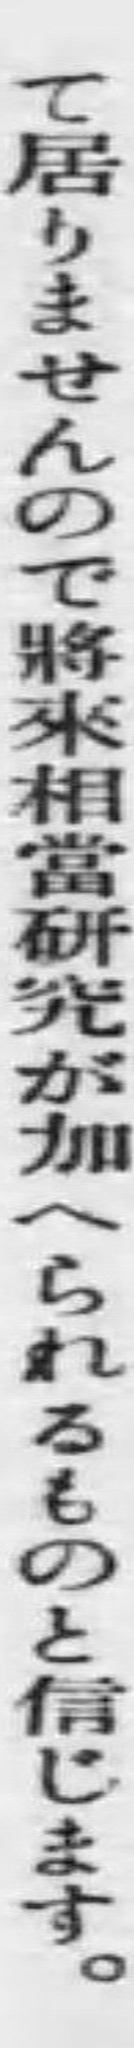て居りませんので将来相当研究が加へられるものと信じます。
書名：東三河道中記 : 豊橋市及其附近案内
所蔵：国立国会図書館 National Diet Library, JAPAN
